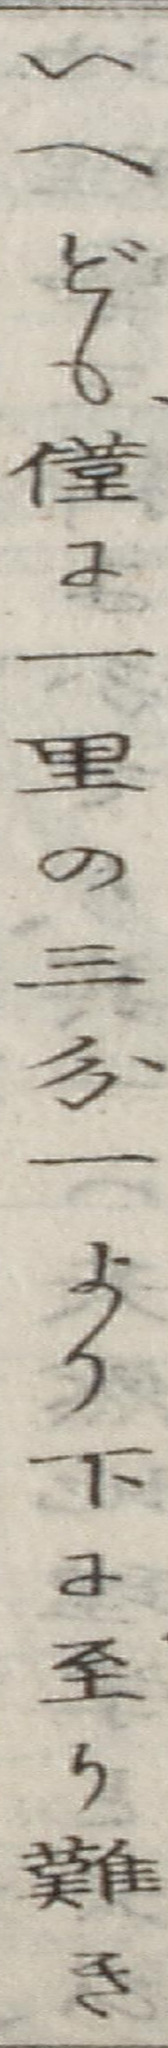いへども，僅に一里の三分一より下に至り難き
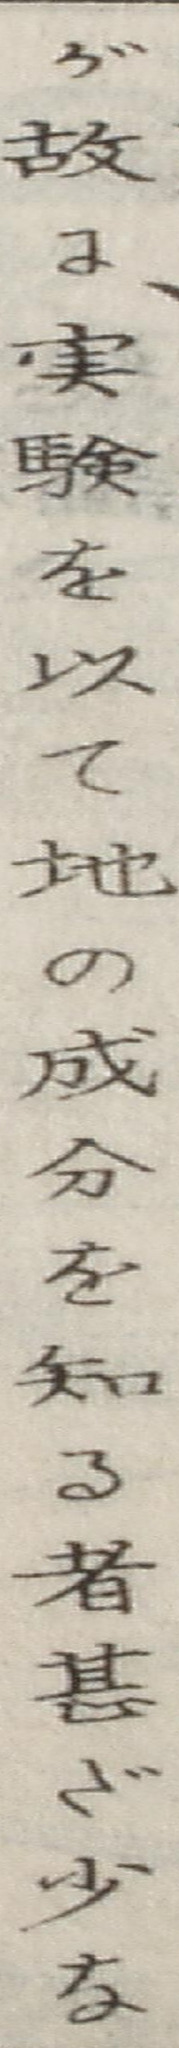が故に，実験を以て地の成分を知る者甚だ少な
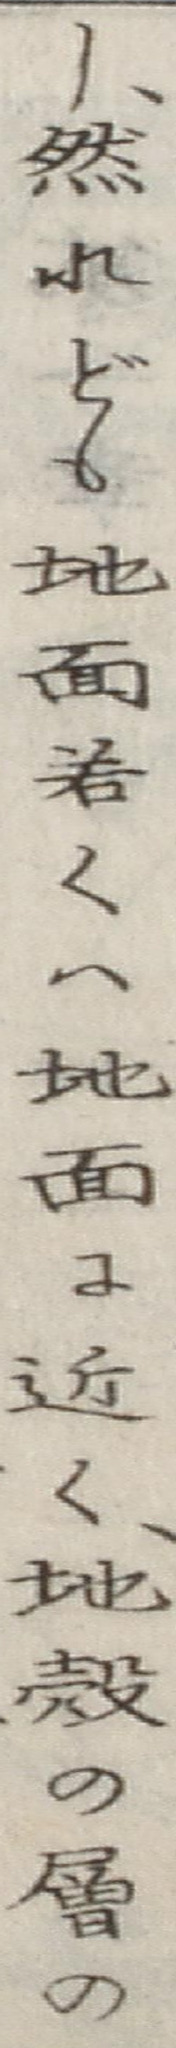し、然れども地面若しくは地面に近く，地殻の層の
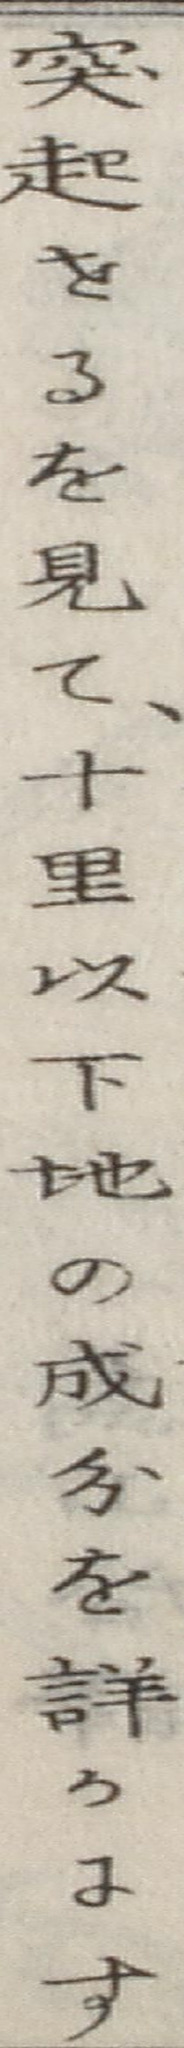突起せるを見て十里以下地の成分を詳かにす
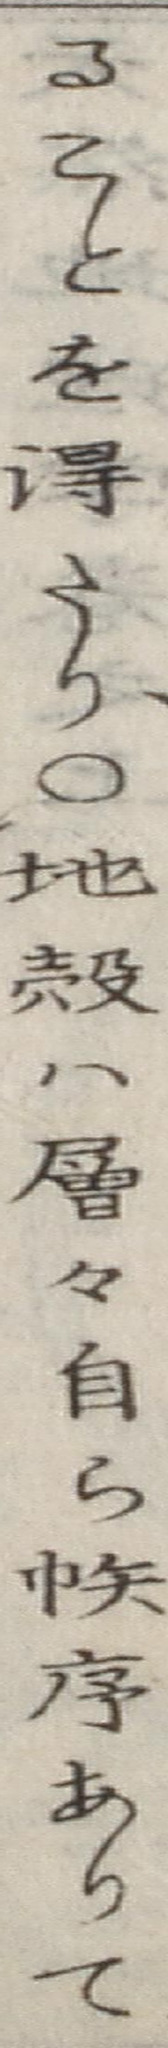ることを得たり、〇地殻は層々自ら帙序ありて、
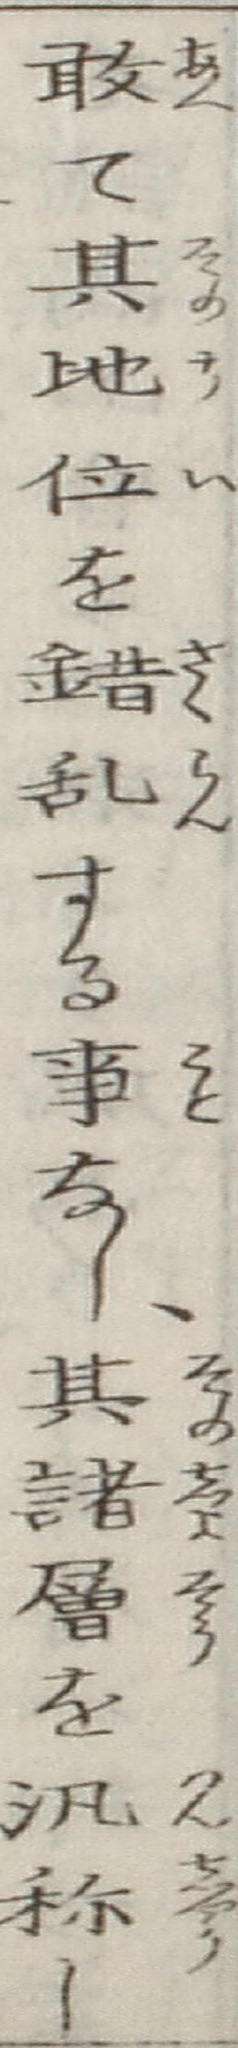敢て其地位を錯乱する事なし、其諸層を汎称し
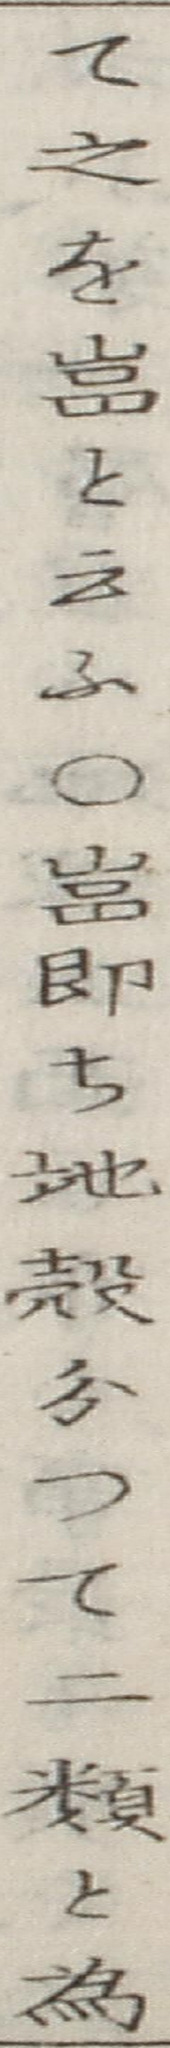て之を嵓と云ふ、〇嵓即ち地殻分つて二類と為
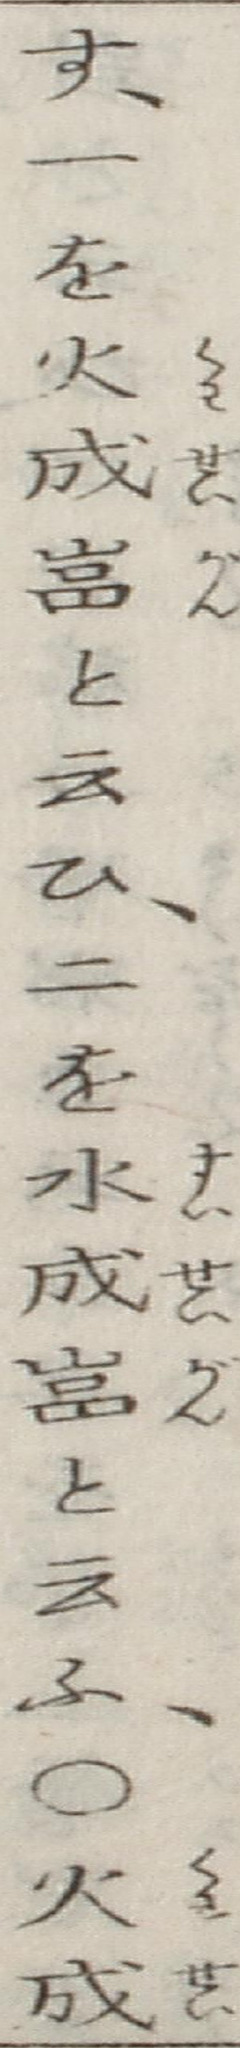す、一を火成嵓と云ひ、二を水成嵓と云ふ、〇火成
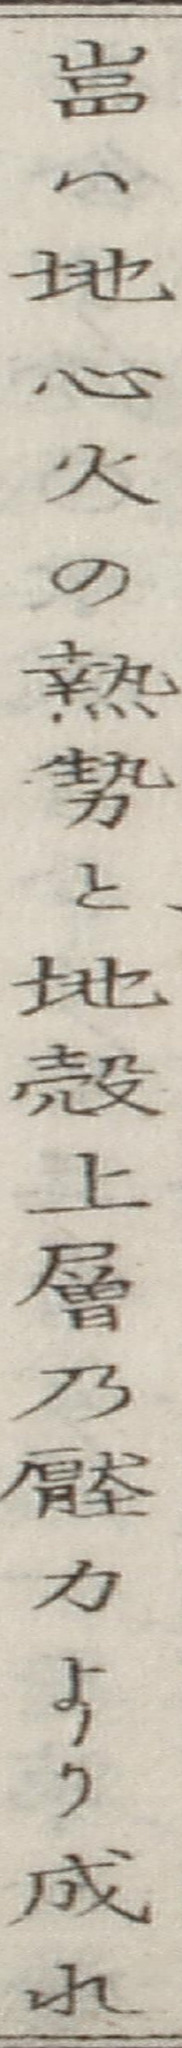嵓は地心火の熱勢と、地殻上層の圧力より成れ
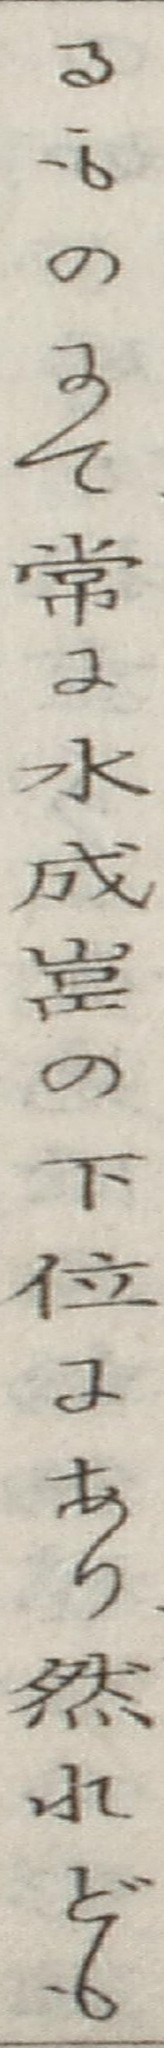るものにて、常に水成嵓の下位にあり、然れども
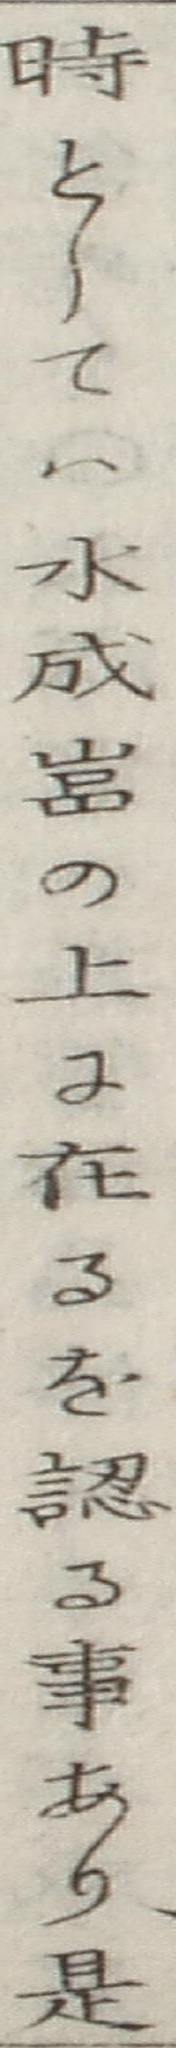時としては水成嵓の上に在るを認る事あり、是
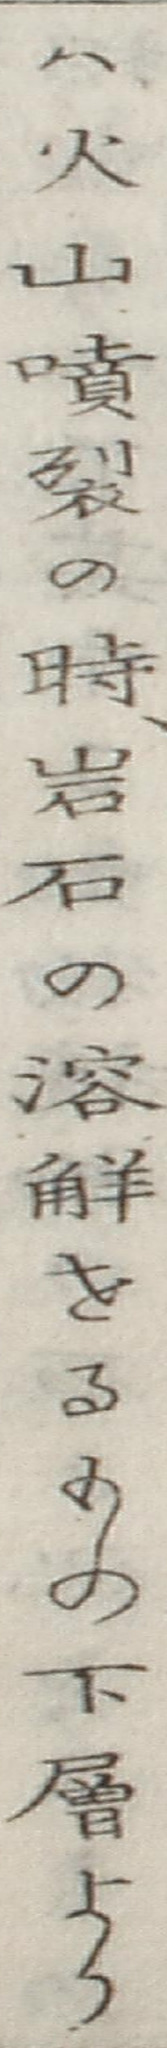は火山噴裂の時、岩石の溶解せるもの、下層より
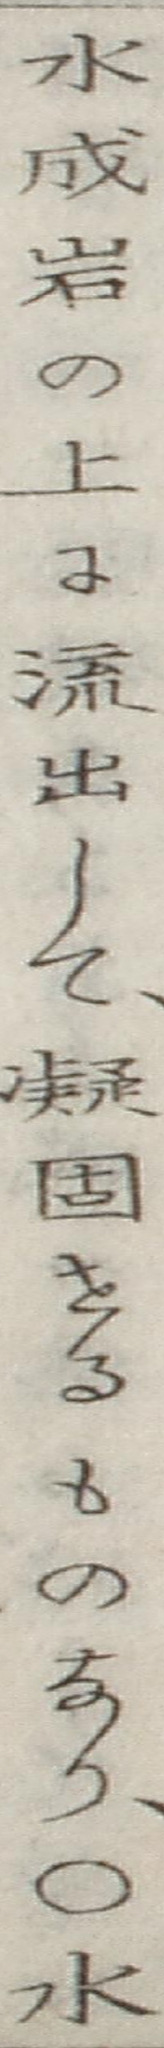水成岩の上に流出して、凝固せるものなり、〇水
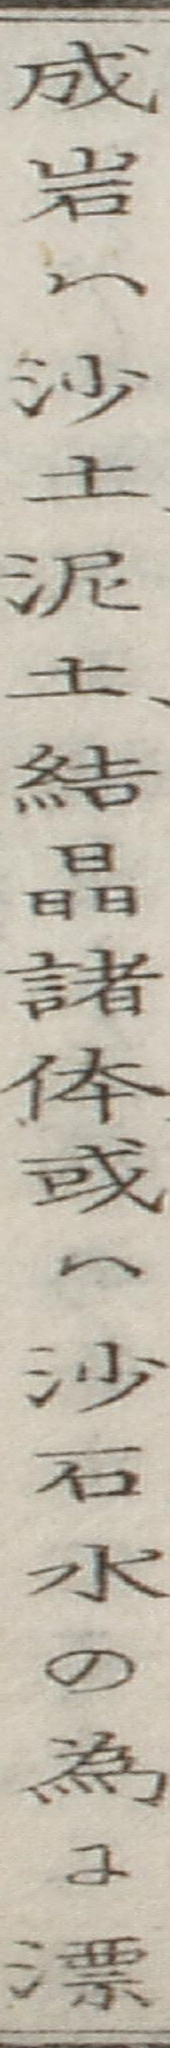成岩は沙土、泥土、結晶諸体、或は沙石、水の為に漂

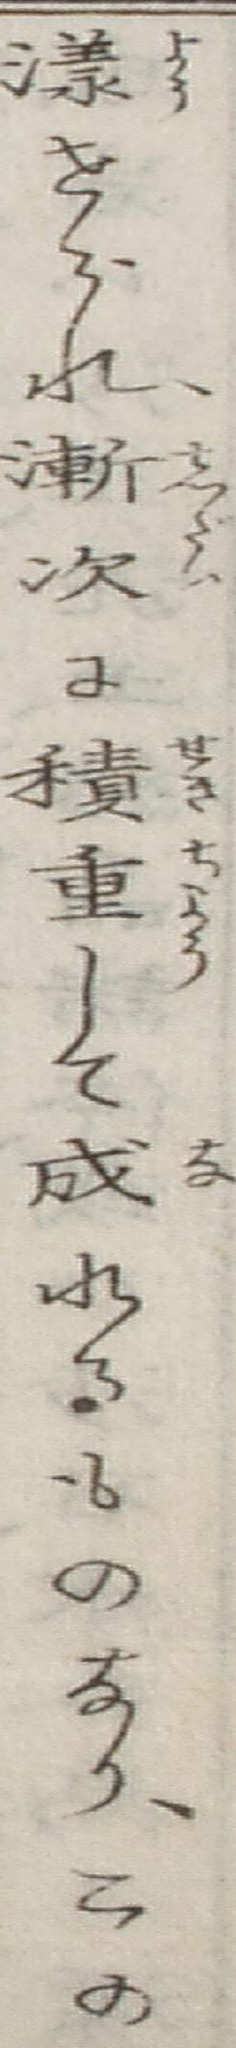様せられ、漸次に積重して成れるものなり、この
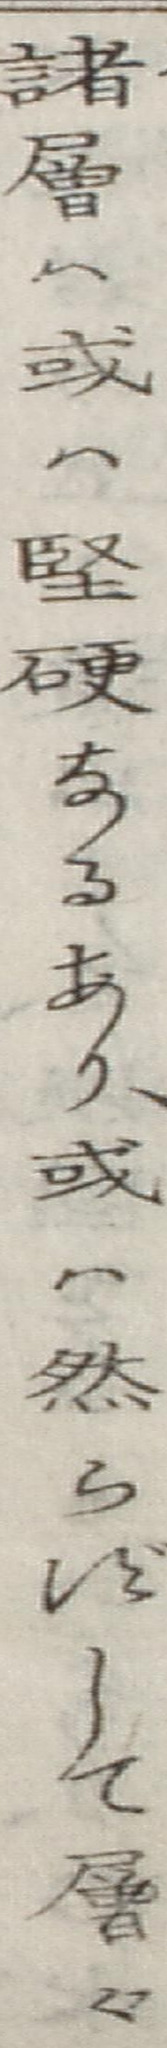諸層は或は堅硬なるあり、或は然らずして層々
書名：訓蒙　天然地理學　上
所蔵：東京大学地震研究所図書室 Earthquake Research Institute Library, The University of Tokyo, JAPAN
